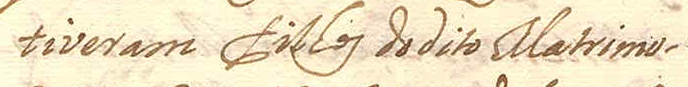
tiveram filhos do dito Matrimo
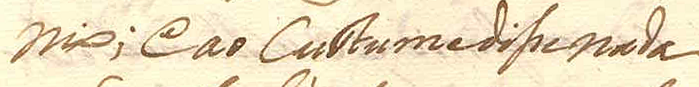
nio; e ao Custume disse nada
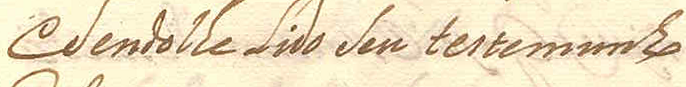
e Sendolhe Lido seu testemunho
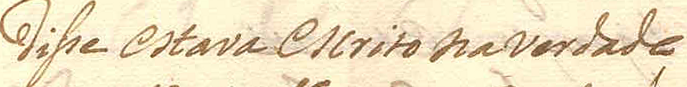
disse estava escrito na verdade,
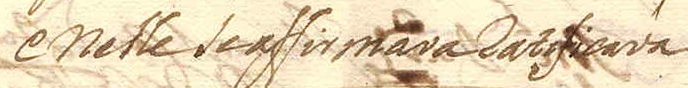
e nelle se affirmara Ratificava
